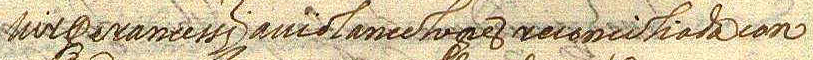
uir perante ssj a uiolante lopes reconçiliada con
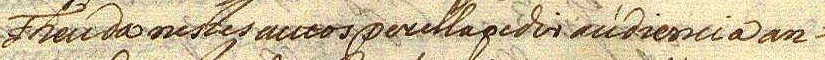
theuda nestes autos por ella pedir audiençia an
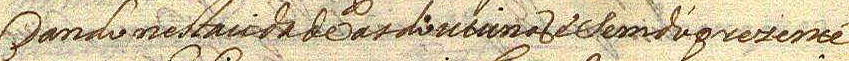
dando nesta cidade as doutrinas e semdo prezente
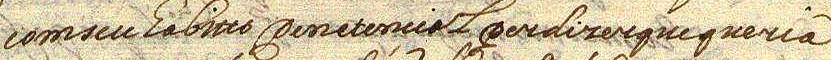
com seu habitto penetençial per dizer que queria
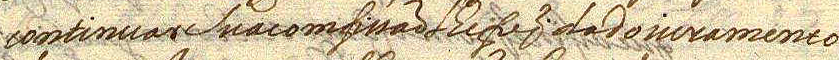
continuar sua comfissaõ lhe foj dado iuramento
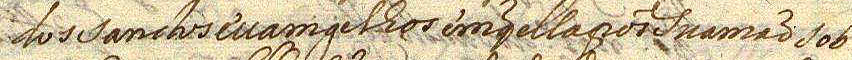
dos sanctos euamgelhos em q̄ ella pos sua maõ sob
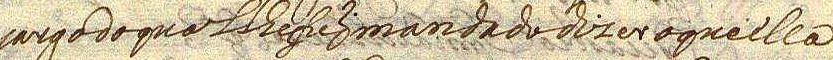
cargo do qual lhe foj mandado dizer o que ella
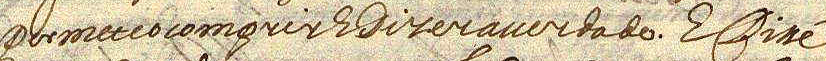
pormeteo comprir E Dizer a uerdade. E Disse
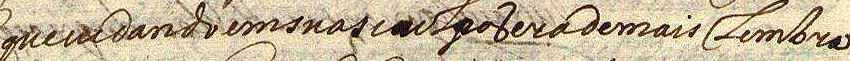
que cuidando em suas culpas era de mais Lembra
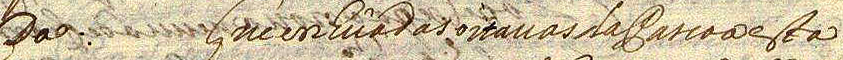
Da. Que em hūa das oitauas da Pascoa esta
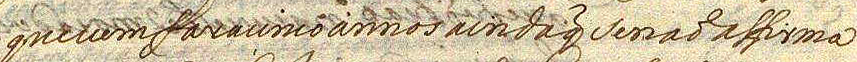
que uem fara çinco annos ainda q̄ se naõ affirma
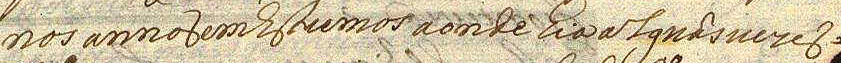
nos annos em Estremos aonde hia alguās uezes
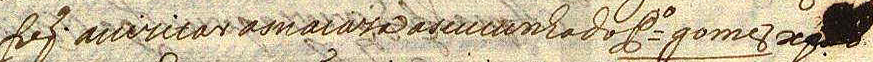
foj a uizitar a sua caza a seu cunhado Po gomes xp_
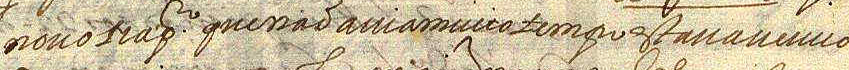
nouo trap.ro que naõ auia muito tempo estaua ueuuo
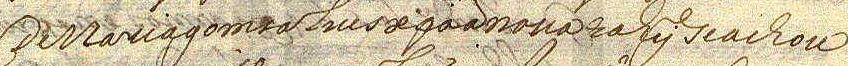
de Maria gomsalues xpaā noua E ahj se achou
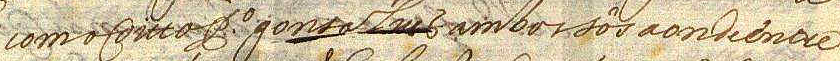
com o ditto P.o gonsalues ambos sos aonde entre
